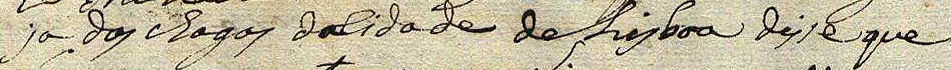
ja das chagas da Cidade de Lisboa disse que
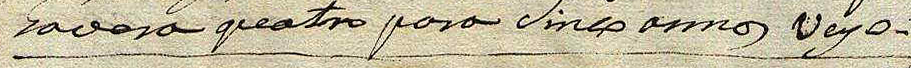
havera quatro para sinco annos veyo
